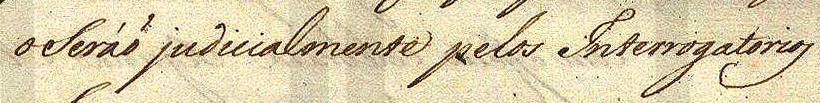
o Seraõ judicialmente pelos Interrogatorios
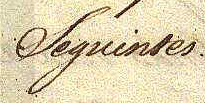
Seguintes.
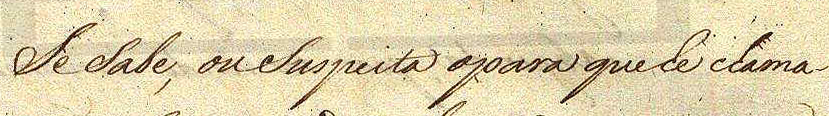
Se sabe, ou suspeita o para que he chama
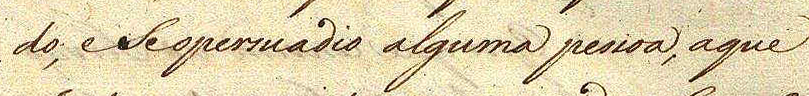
do, e se o persuadio alguma pessoa, a que
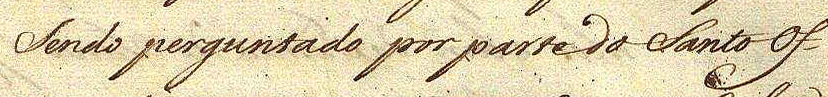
sendo perguntado por parte do Santo Of
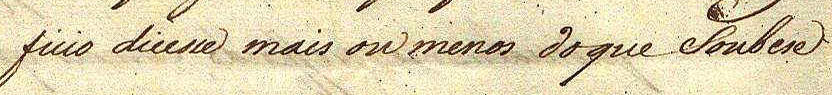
ficio dicesse mais ou menos do que Soubese
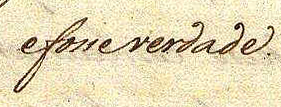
e fosse verdade.
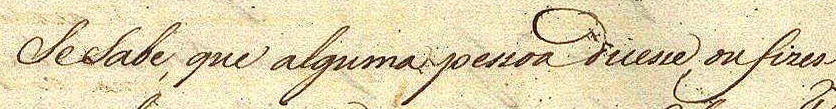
Se sabe, que alguma pessoa dicesse, ou fizes
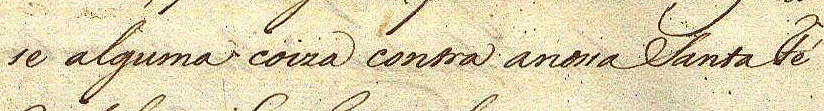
se alguma coiza contra a nossa Santa Fé
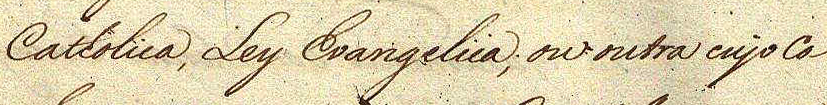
Catholica, Ley Evangelica, ou outra cujo co
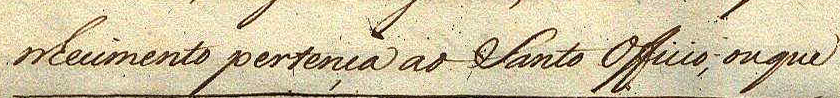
nhecimento pertença ao Santo Officio, ou que
